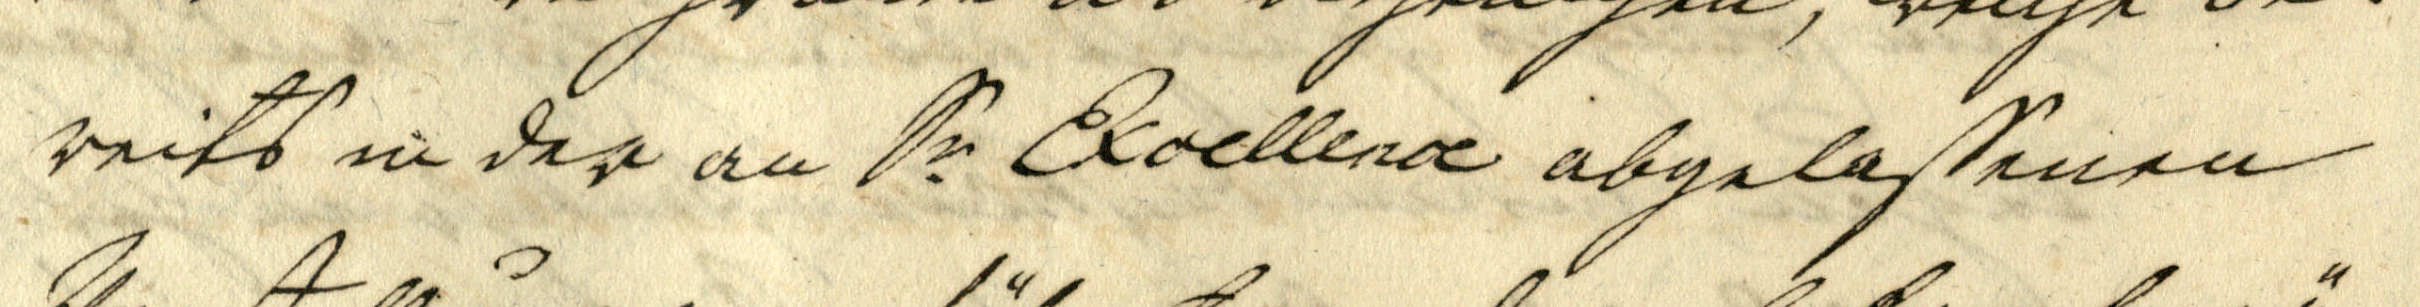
reits in der an Sr Excellence abgelassenen
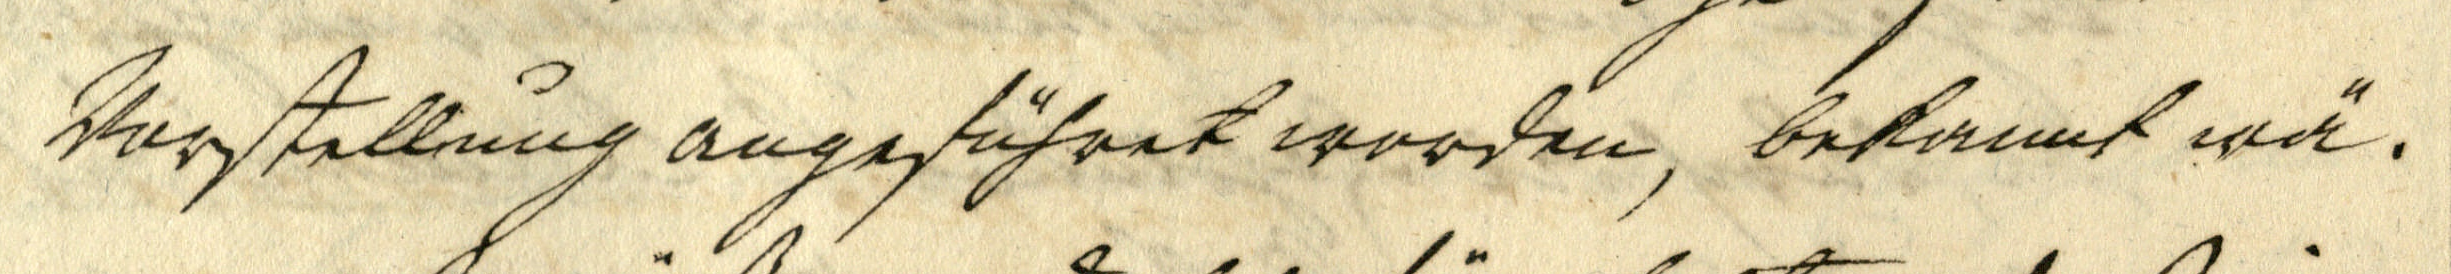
Vorstellung angeführet worden, bekannt wä¬
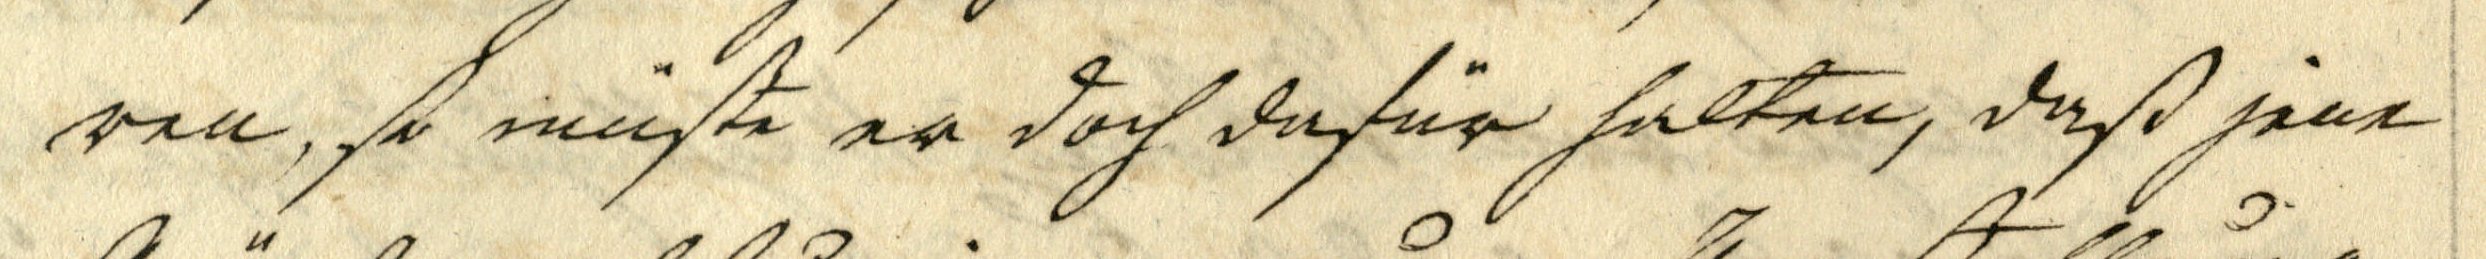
ren, so müßte er doch dafür halten, daß jene
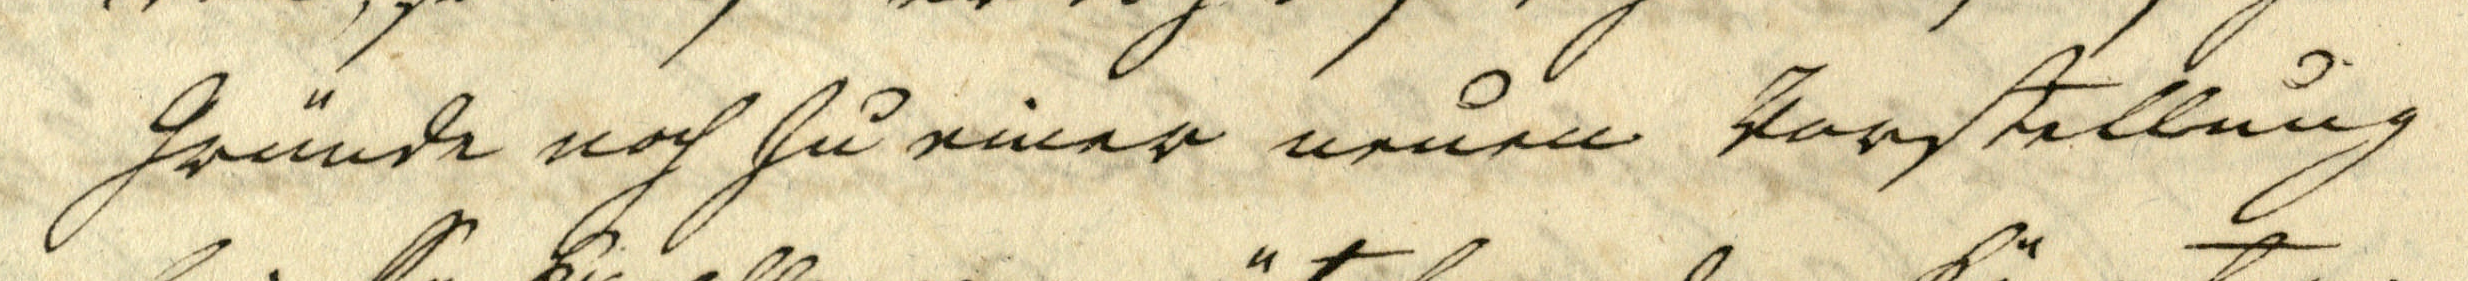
Gründe noch zu einer neuen Vorstellung
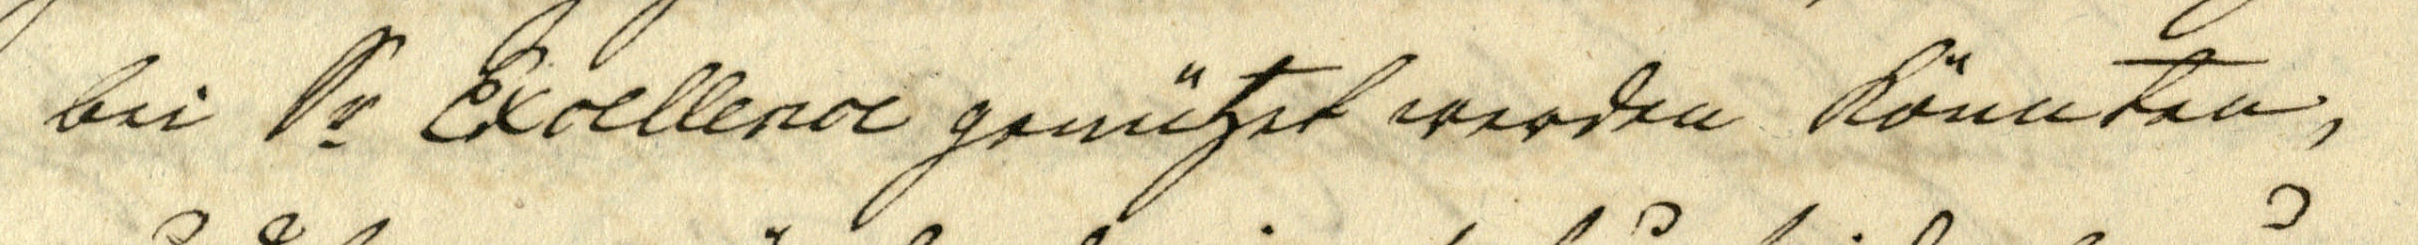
bei Sr Excellence genützet werden könnten,
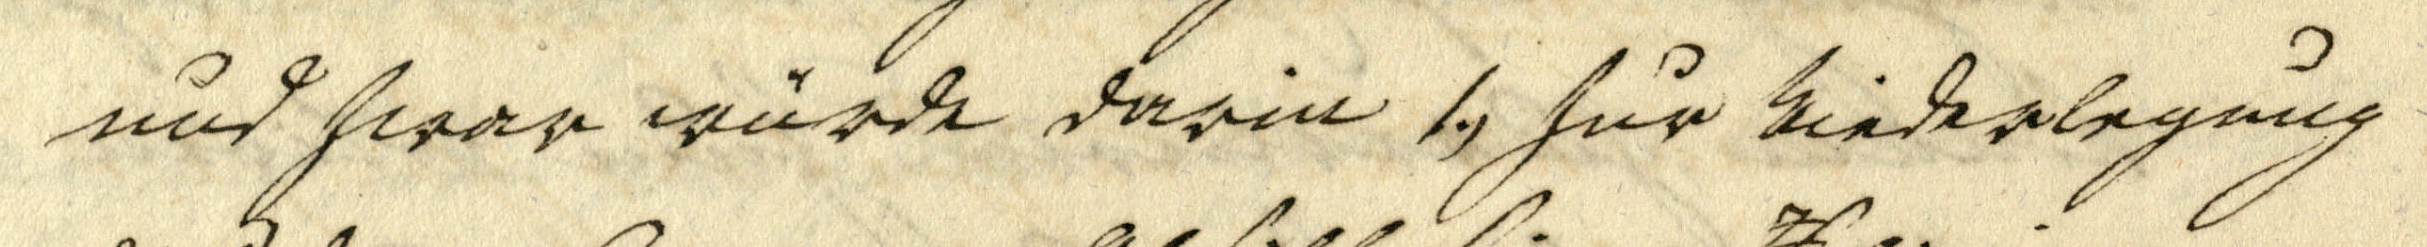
und zwar würde darin 1., zur Wiederlegung
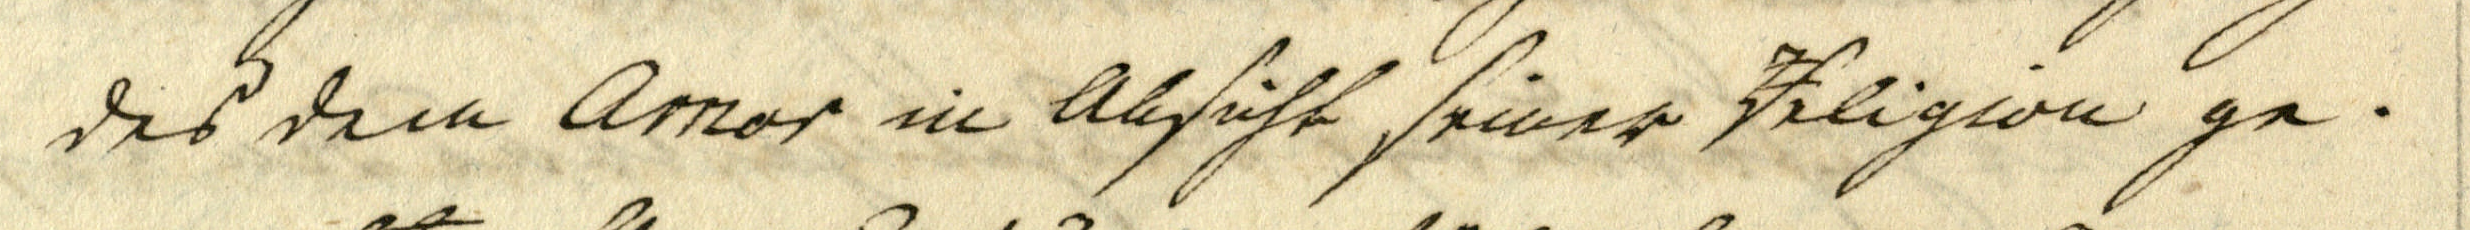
des dem Amor in Absicht seiner Religion ge¬
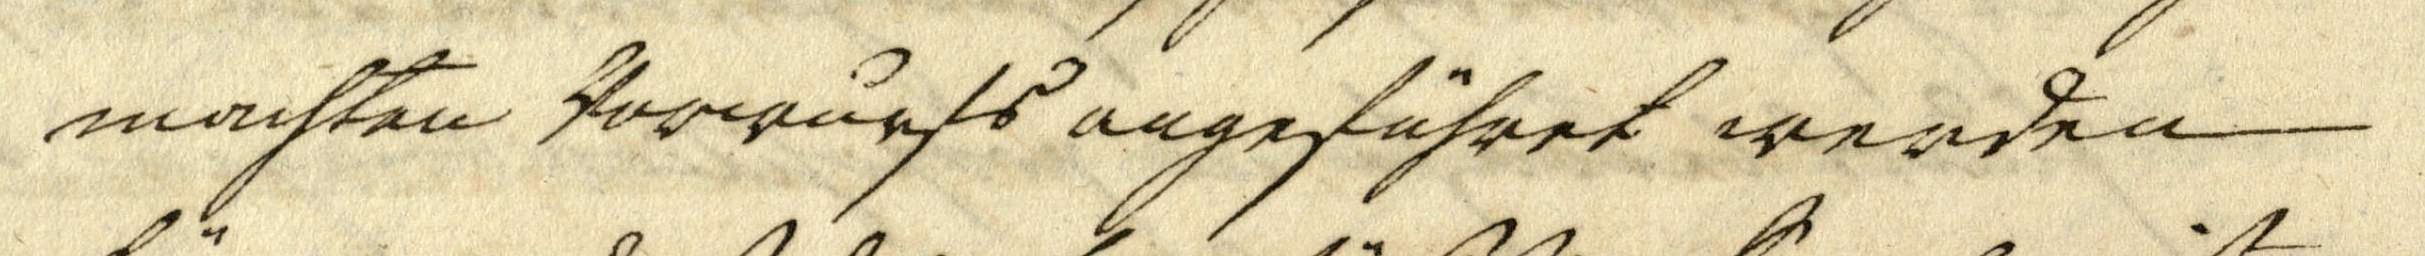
machten Vorwurfs angeführet werden
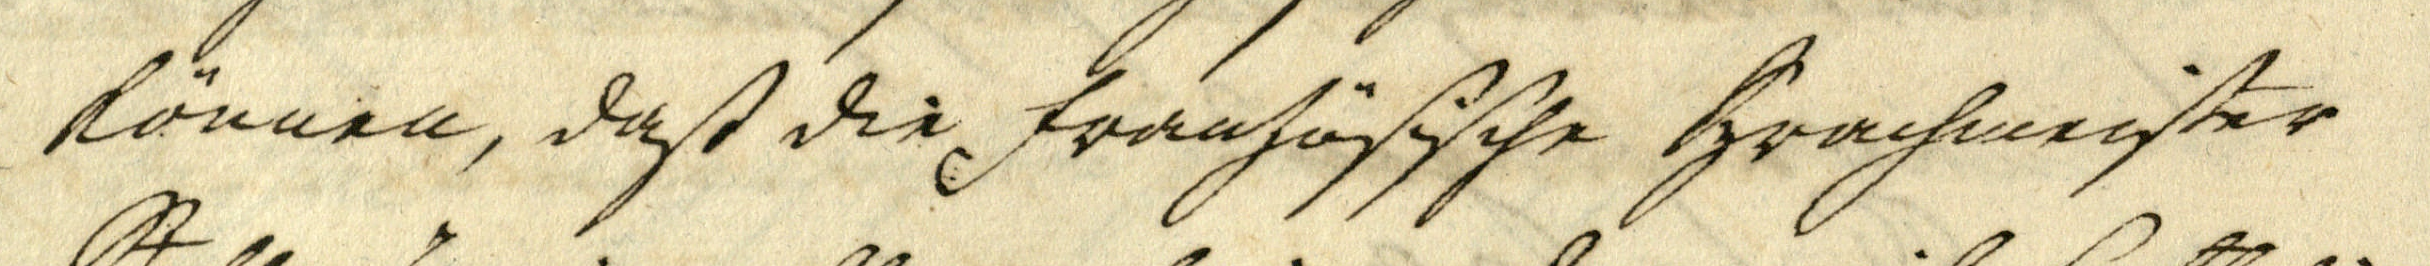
können, daß die Französische Sprachmeister
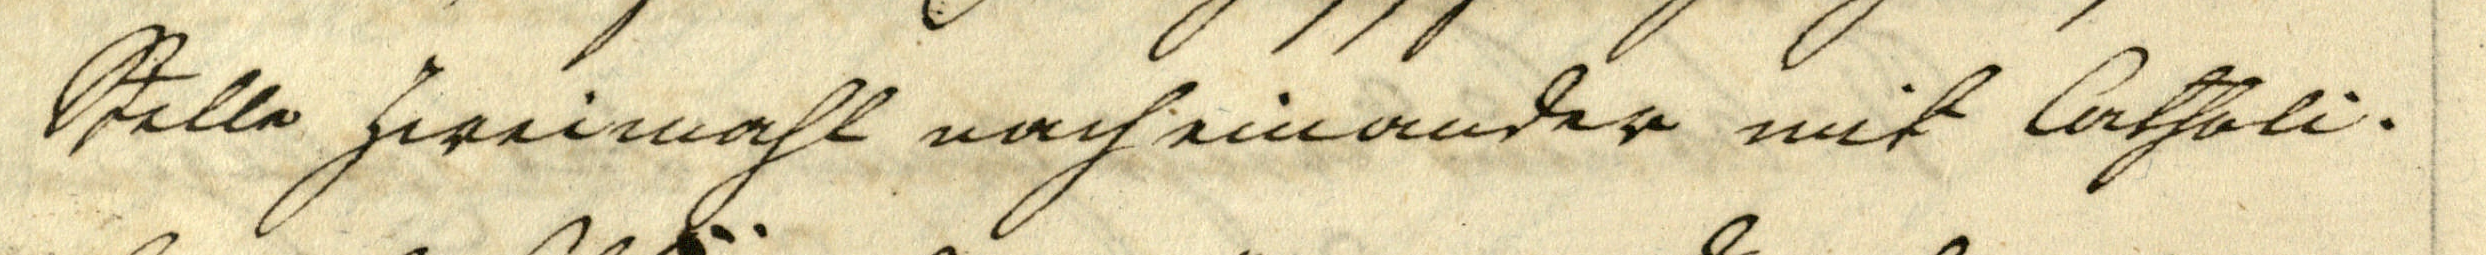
Stelle Zweimahl nach einander mit Catholi¬
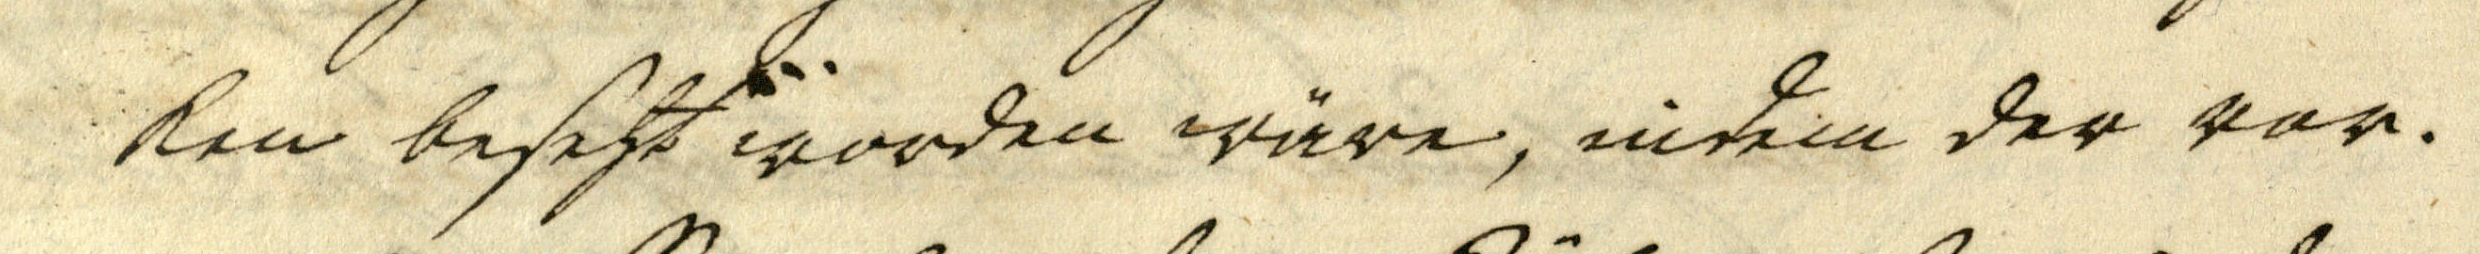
ken besetzt worden wäre, indem der vor
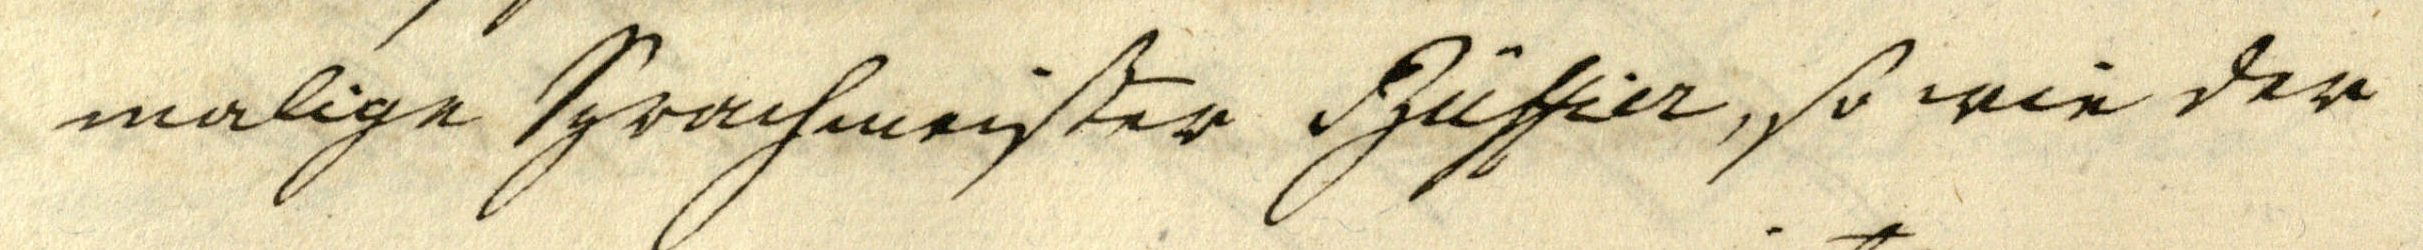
malige Sprachmeister Büffier, so wie der
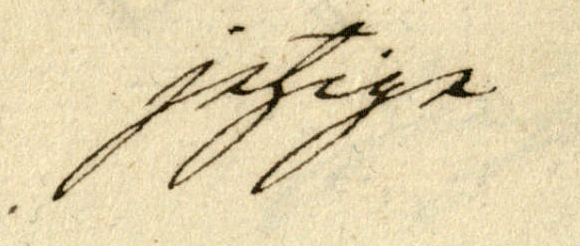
jetzige
